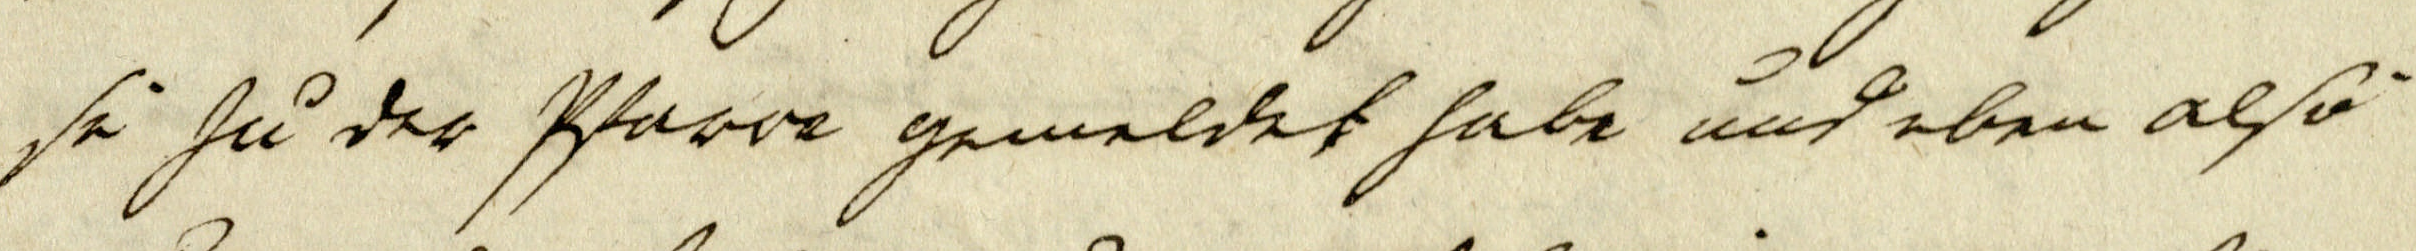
se zu der Pfarre gemeldet habe und eben also
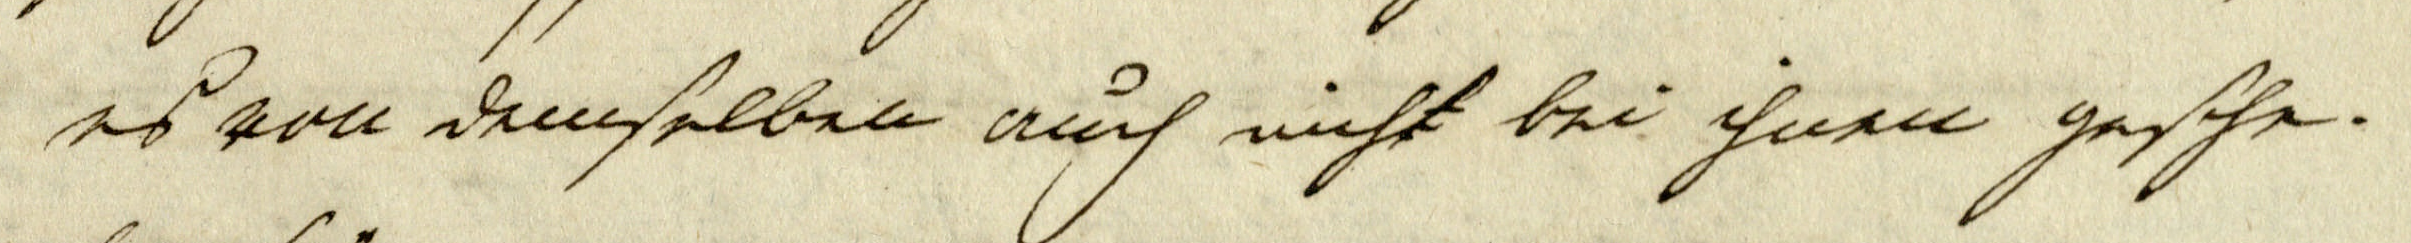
es von demselben auch nicht bei ihnen gesche-
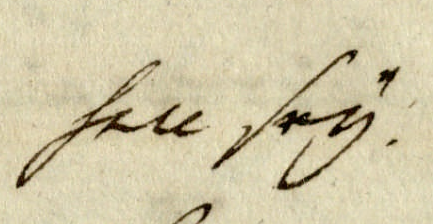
hen seÿ.
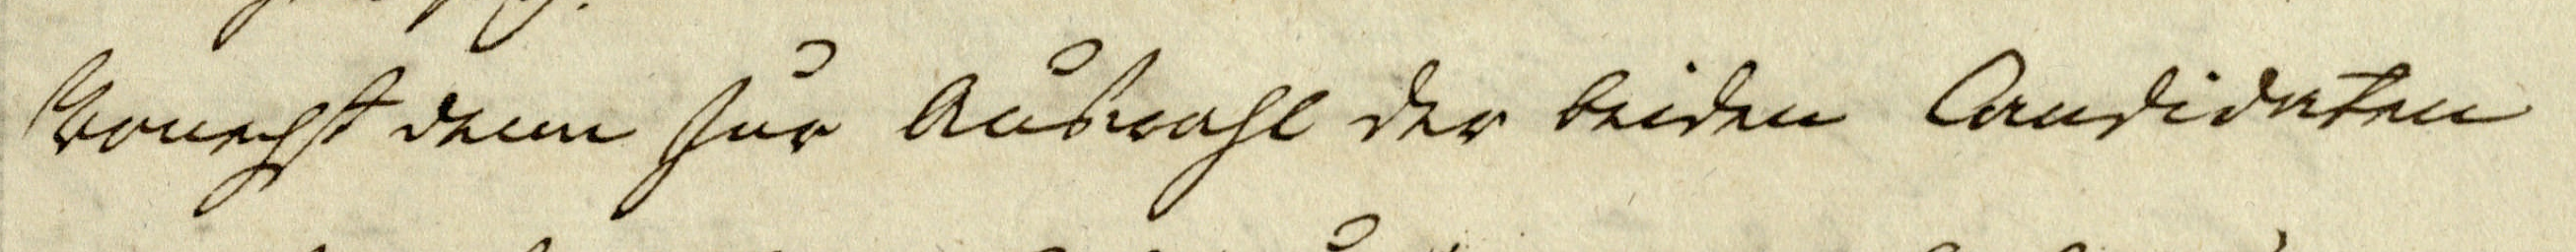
Wonechst dem zur Auswahl der beiden Candidaten
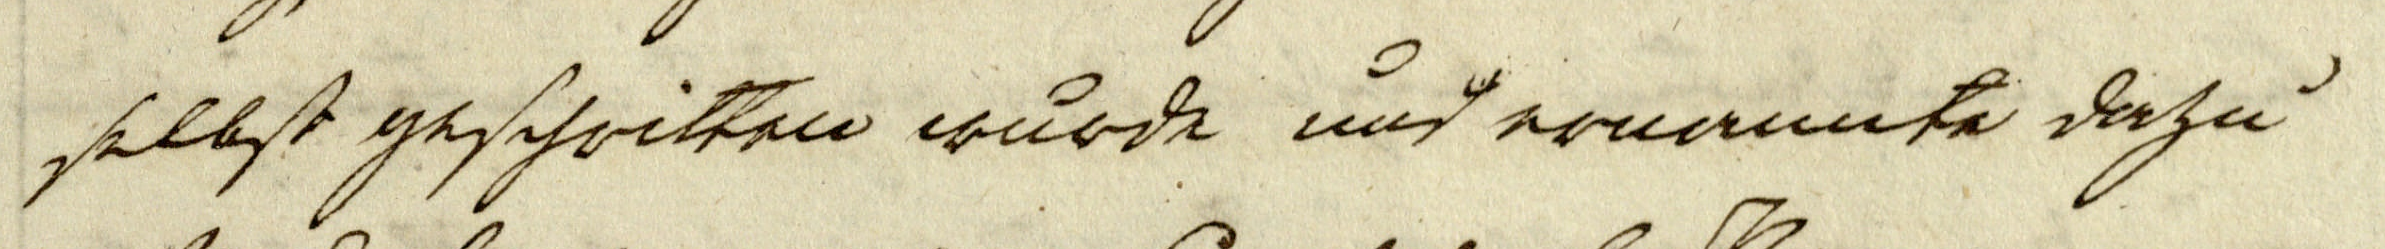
selbst geschritten wurde und ernannte dazu
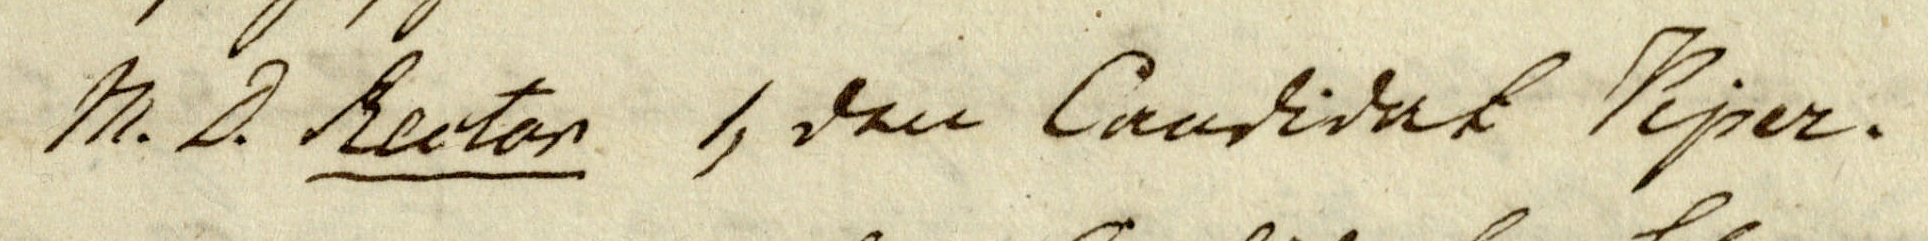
M. D. Rector 1, den Candidat Piper.
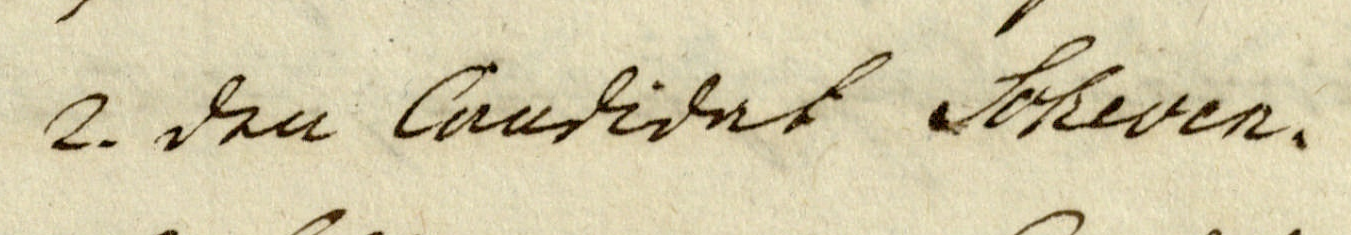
2. den Candidat Scheven.
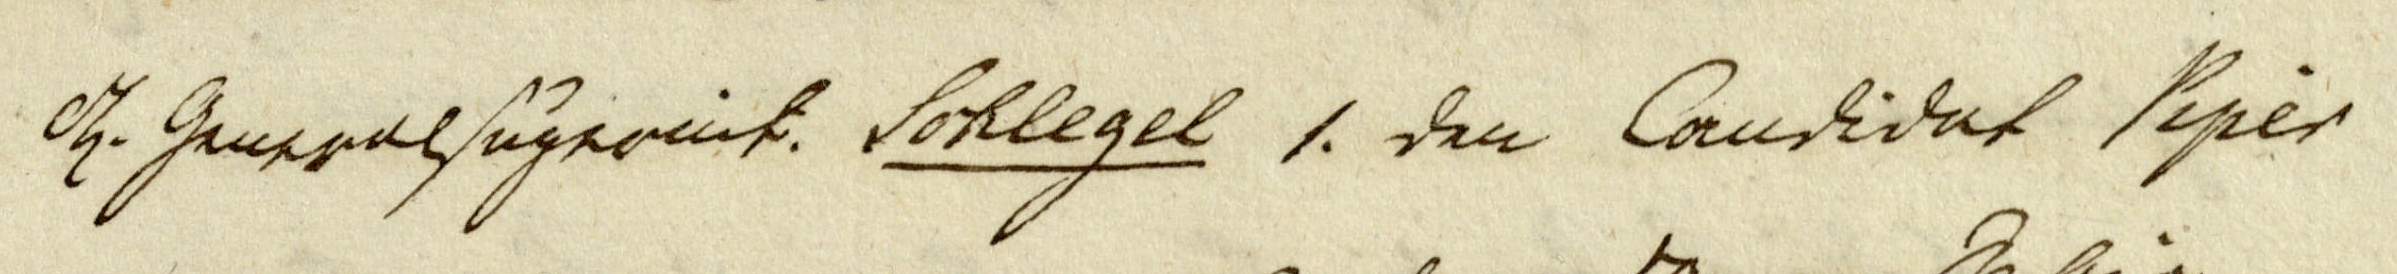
dh. Generalsuperint. Schlegel 1. den Candidat Piper
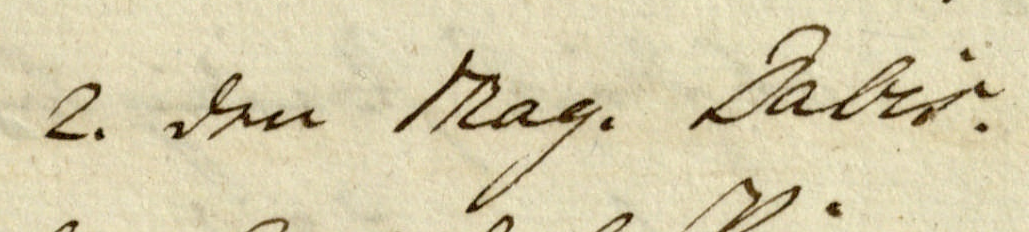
2. den Mag. Dabis.
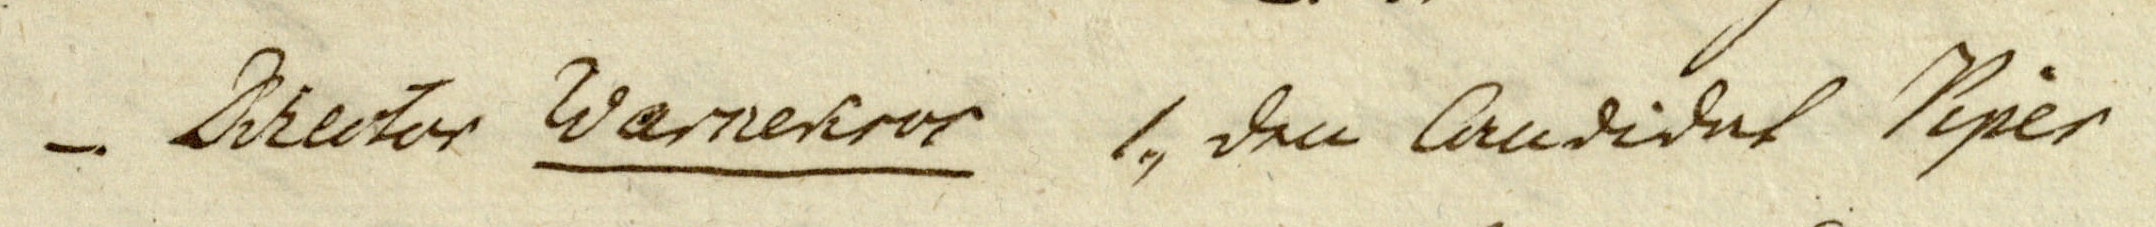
Director Warnekros 1., den Candidat Piper
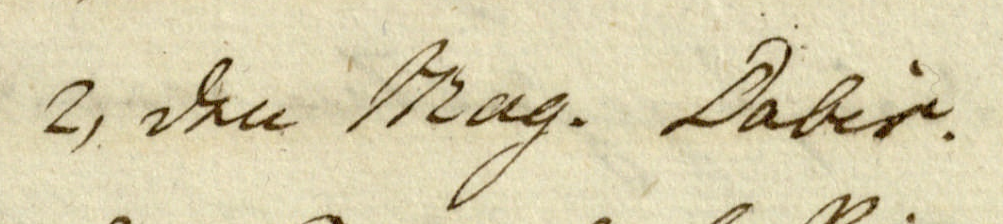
2, den Mag. Dabis.
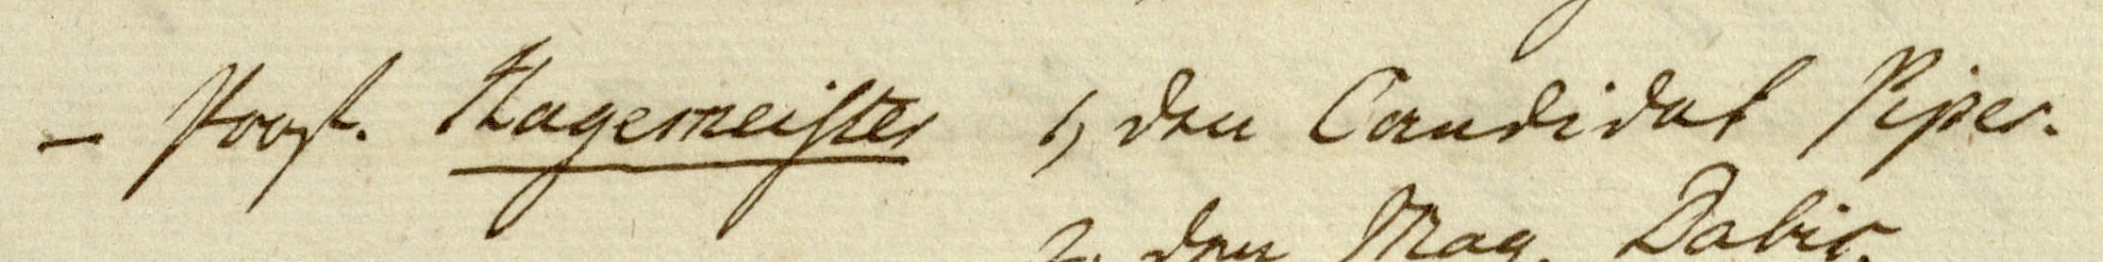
Prof. Hagemeister 1, den Candidat Piper.
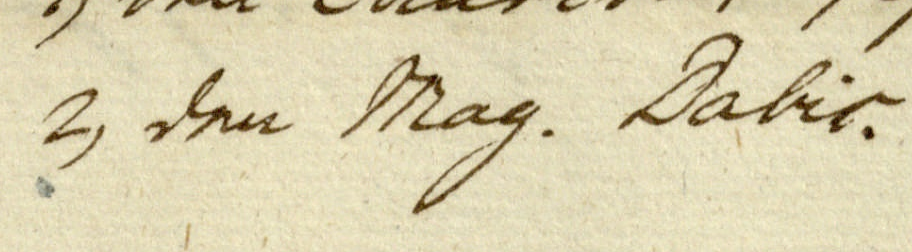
2., den Mag. Dabis¬
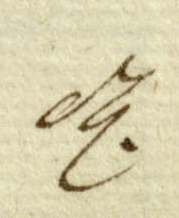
dh.
